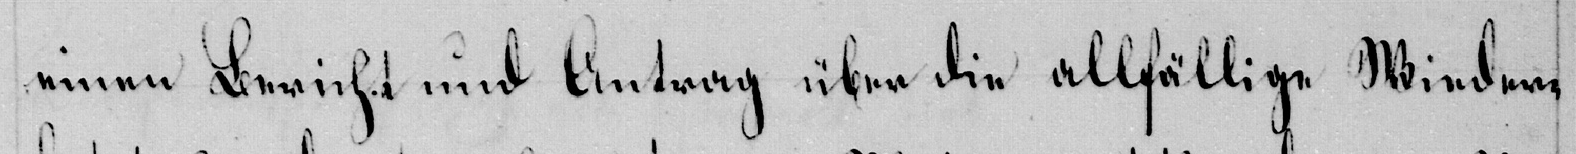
einen Bericht und Antrag über die allfällige Wieder¬
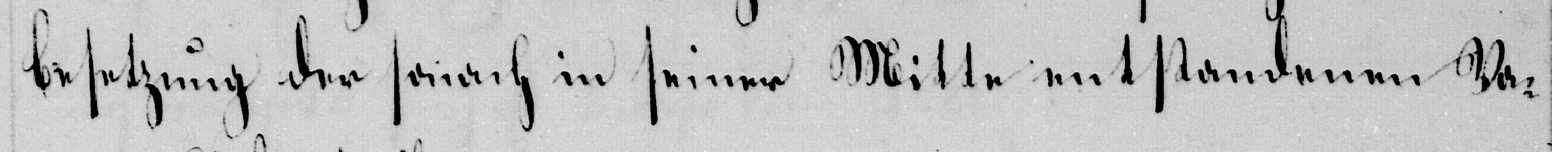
besetzung der sonach in seiner Mitte entstandenen Va¬
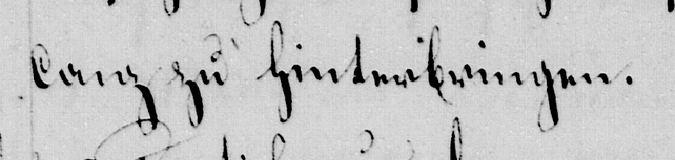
canz zu hinterbringen.
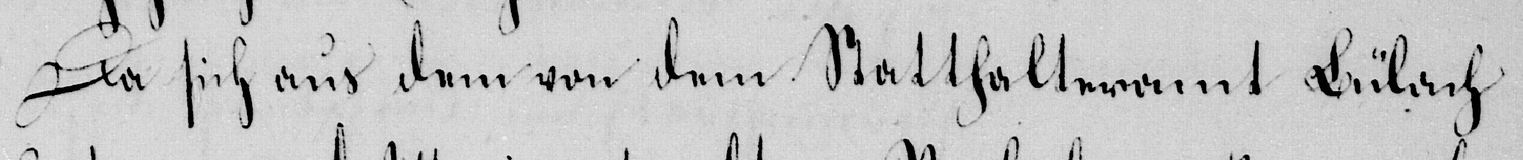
Da sich aus dem von dem Statthalteramt Bülach
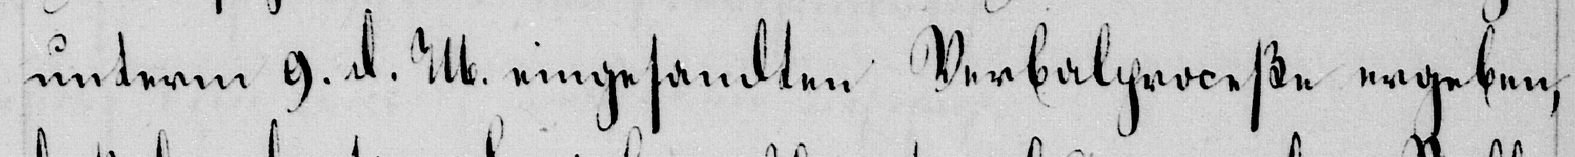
unterm 9. d. M. eingesandten Verbalproceße ergeben,
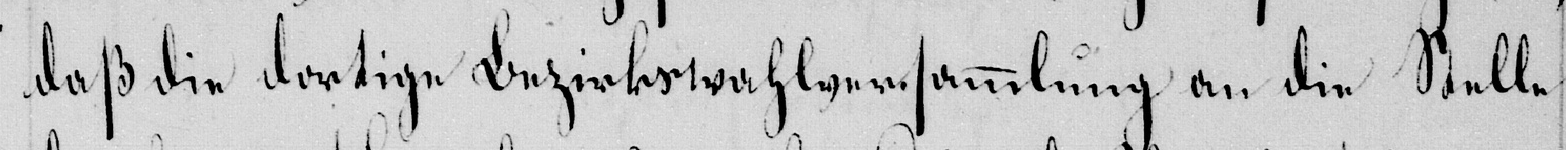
daß die dortige Bezirksversammlung an die Stelle
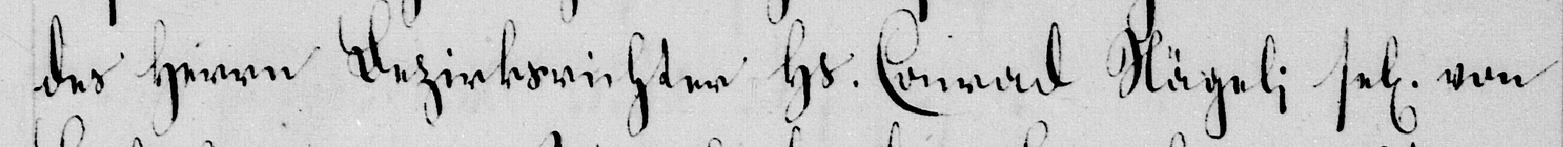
des Herrn Bezirksrichter Hs. Conrad Nägeli sel[ig] von
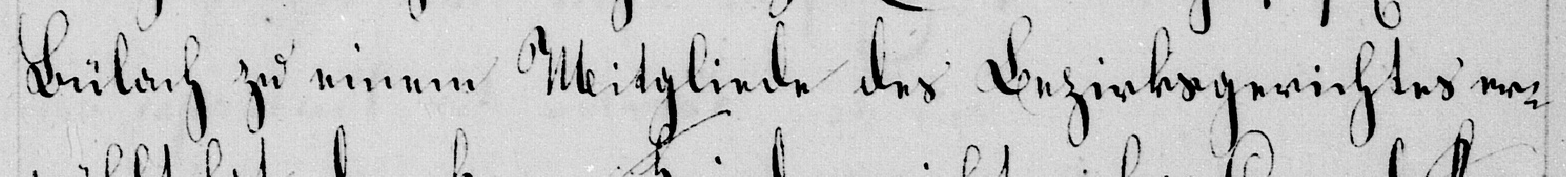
Bülach zu einem Mitgliede des Bezirksgerichtes er¬
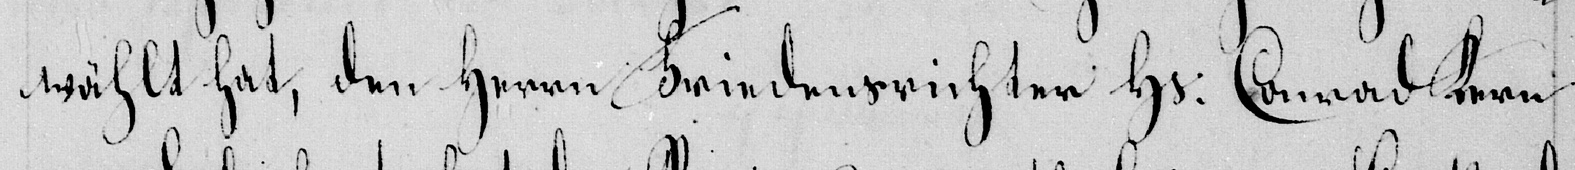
wählt hat, den Herrn Friedensrichter Hs: Conrad Kern
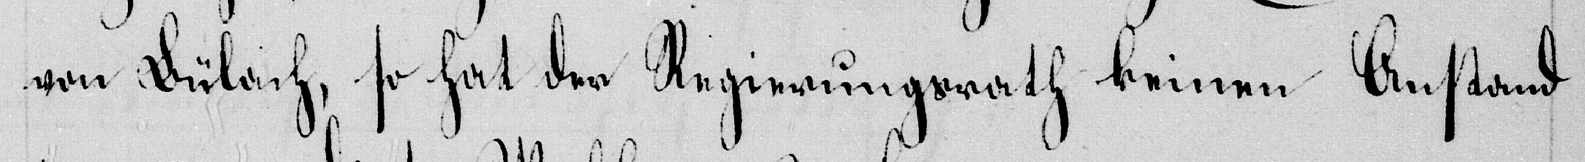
von Bülach, so hat der Regierungsrath keinen Anstand
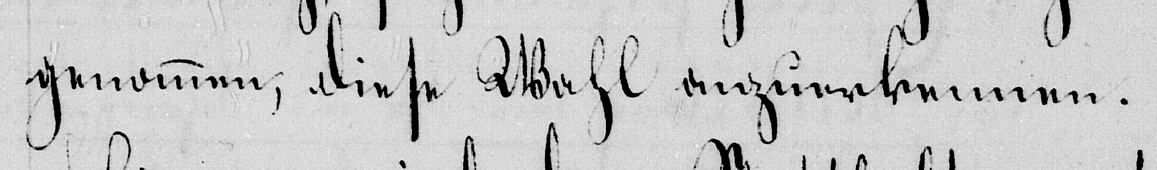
genommen, diese Wahl anzuerkennen.
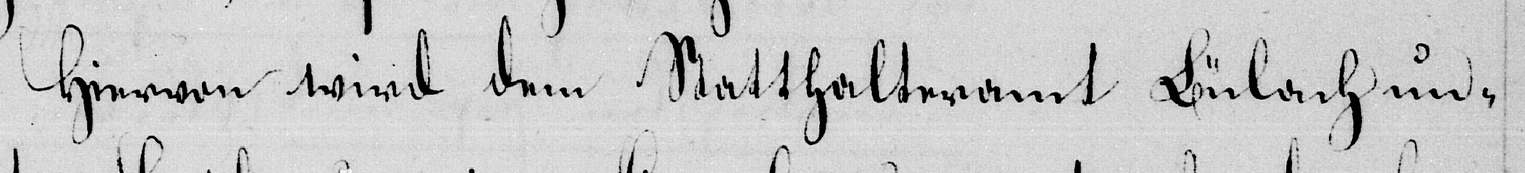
Hiervon wird dem Statthalteramt Bülach un¬
